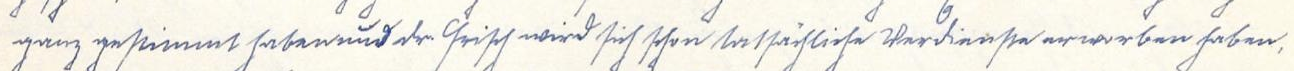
ganz gestimmt haben und der Frisch wird sich schon tatsächliche Verdienste erworben haben,
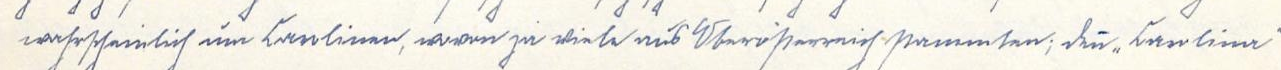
wahrscheinlich um Carolina, wovon ja viele aus Oberösterreich stammten; Die „Caroline“
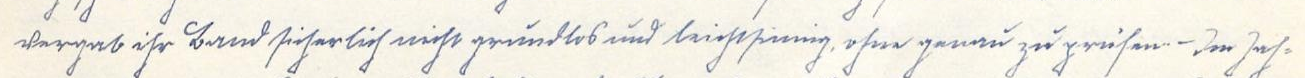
vergab ihr Band sicherlich nicht grundlos und leichtsinnig, ohne genau zu prüfen. Im Jäah-
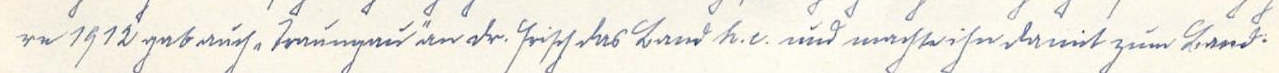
re 1912 gab auch „Traungau“ an Dr. Frisch das Band h. c. und machte ihn damit zum Band-
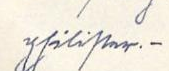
philister.
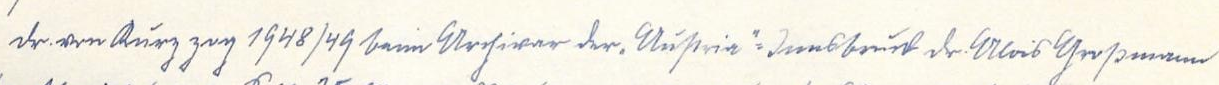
Dr. von Kurz zog 1948/49 beim Archivar der „Austria“ Innsbruck Dr. Alois Großmann
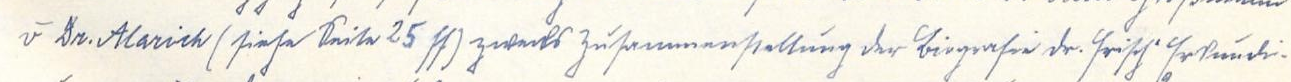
v/o Dr. Alarich (siehe Seite 25 ff) zwecks Zusammenstellung der Biografie Dr. Frisch Erkundi-
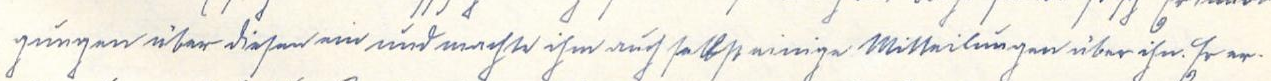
gungen über diesen ein und machte ihm auch selbst einige Mitteilungen über ihn. Er er-
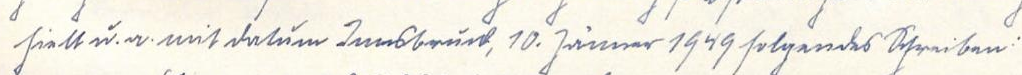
hielt u. a. mit Datum Innsbruck, 10. Jänner 1949 folgendes Schreiben:
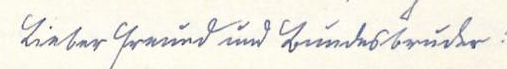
Lieber Freund und Bundesbruder!
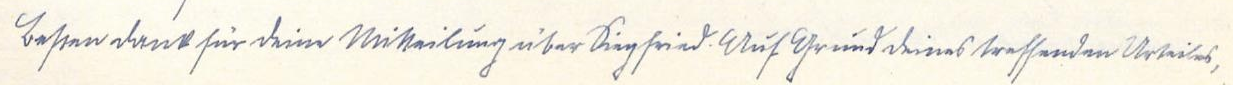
Besten Dank für deine Mitteilungen über Siegfried. Aufgrund dieses betreffenden Urteils,
